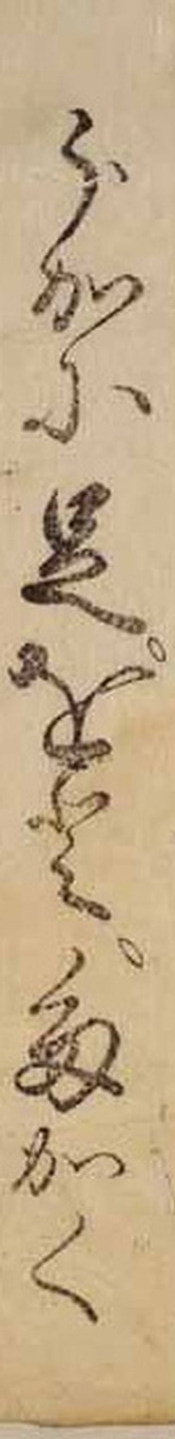らかに足。をと。たかく
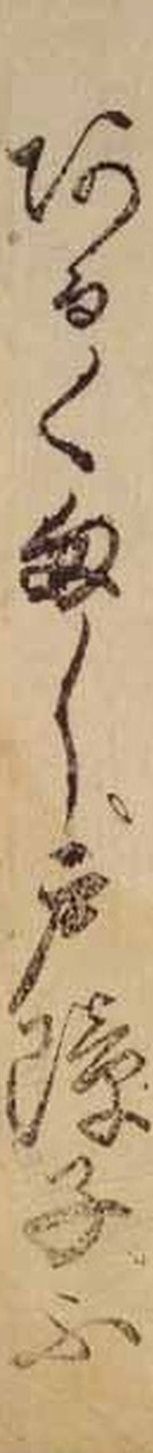あるくまし。戸障子不
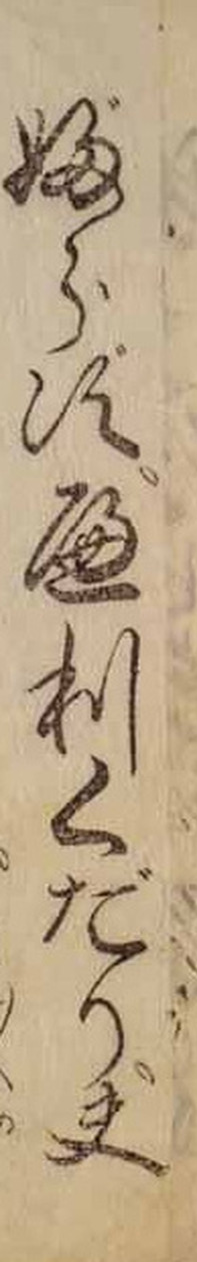ふらず。へりくだり。夫
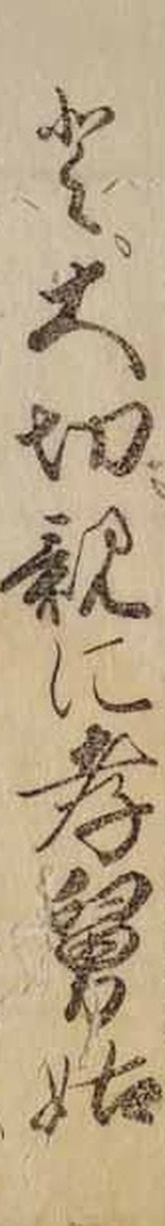と。大切。親に孝。舅姑
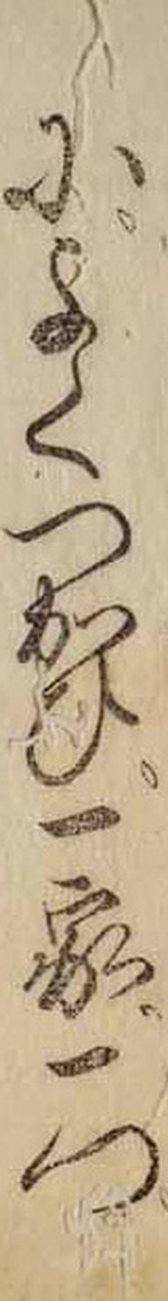に。よくつかひ。一家。一門。
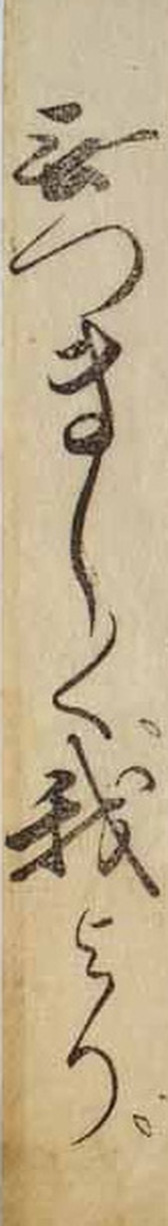むつましく。我より。

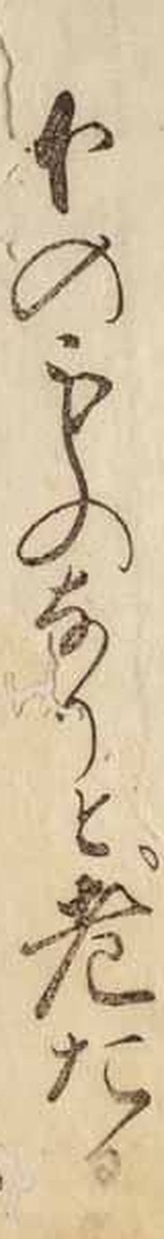下のものなりと。老たる
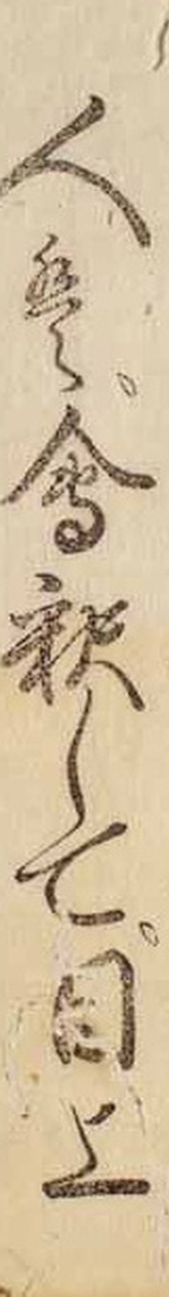人は。会釈して。目上。
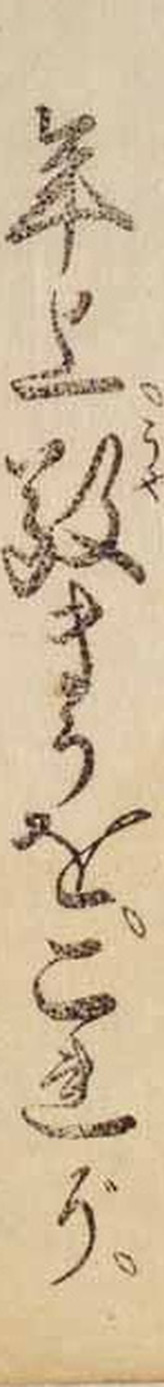年上。敬まうを。これが。
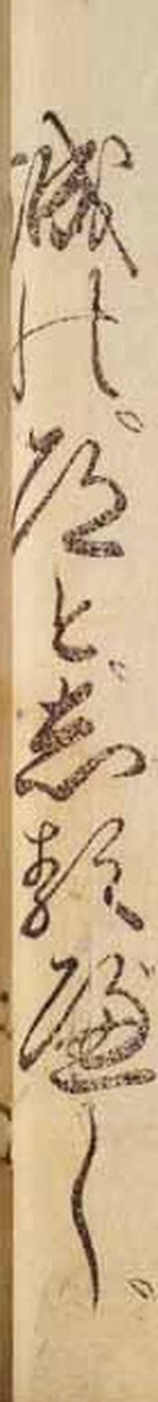誠の。道と。しるべし。
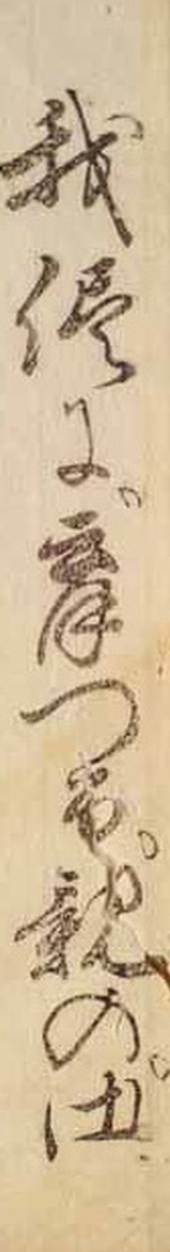我儘に。育つる。親の。御
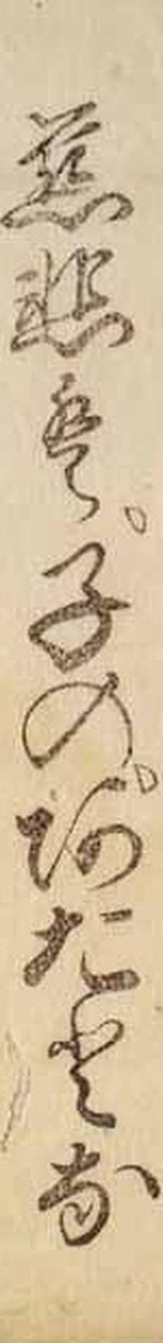慈悲は。子の。あたとな
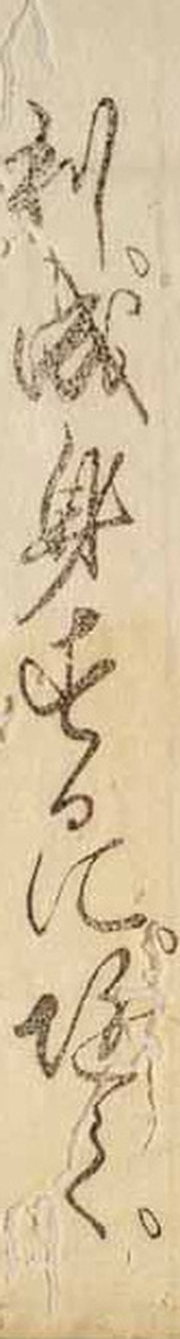り。成身するに。随て。
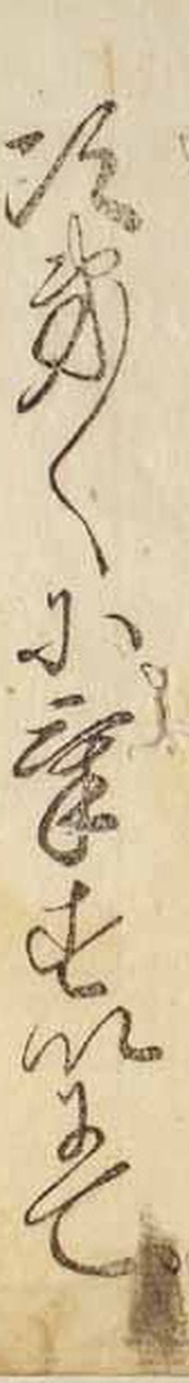次第〳〵に気すいにて。

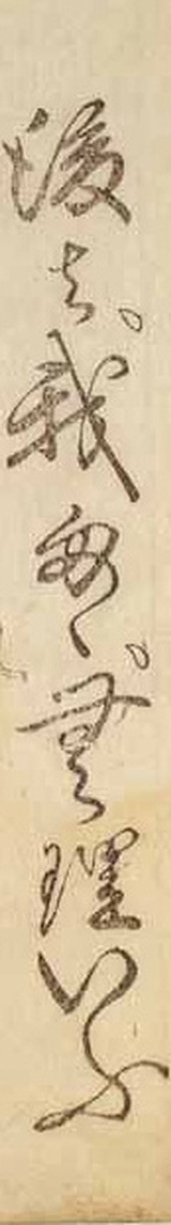後は。我まゝ。無理いふ
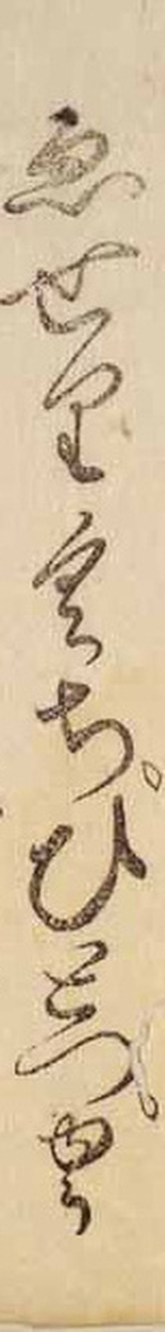ゑせりくち。ひとつ。ゆう
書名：寺子躾方
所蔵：東京学芸大学教育コンテンツアーカイブ
